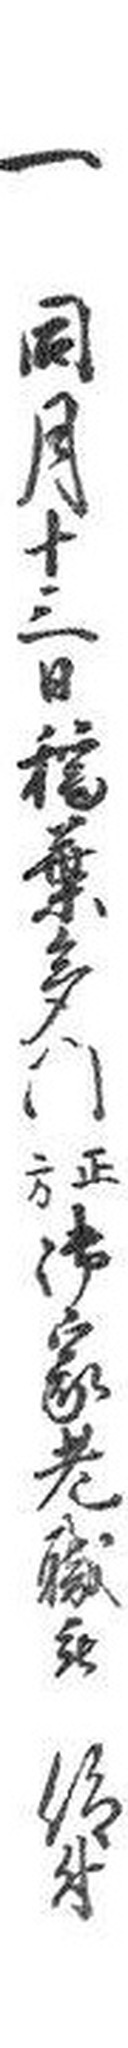一同月十三日稲葉多門正方御家老職被仰付
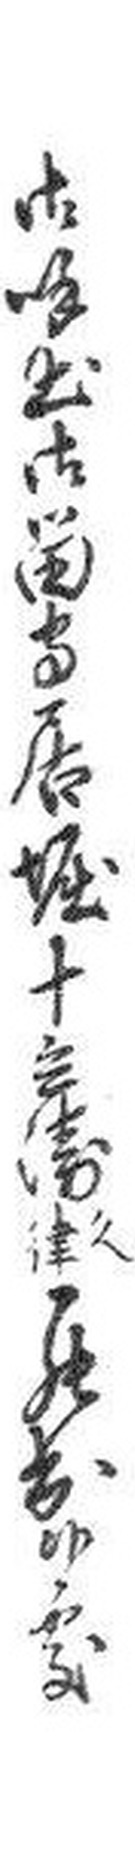御呼出御留守居堀十兵衛久律罷出候処
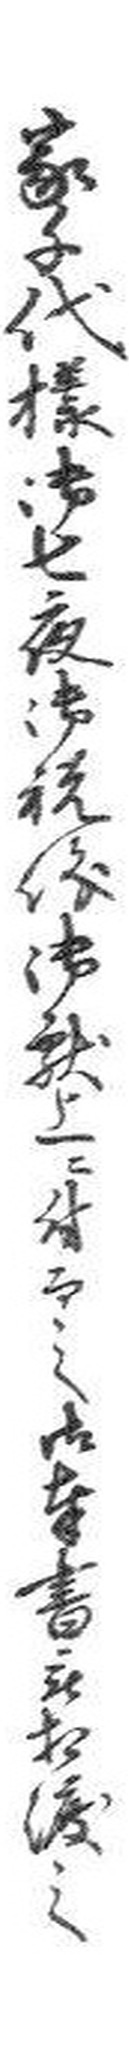家千代様御七夜御祝儀御献上ニ付而之御奉書被相渡之
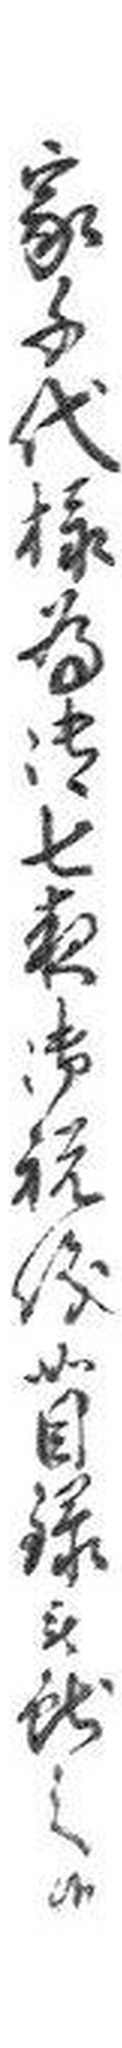家千代様御七夜御祝儀如目録被献之候
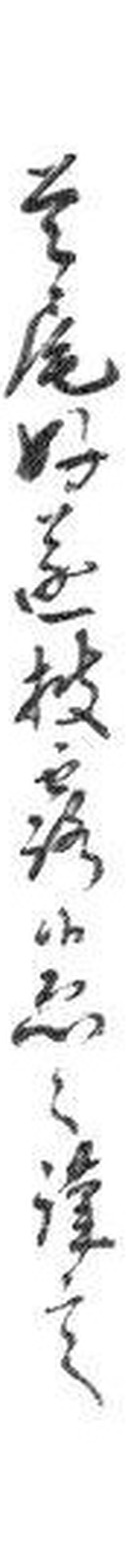首尾好遂披露候恐々謹言
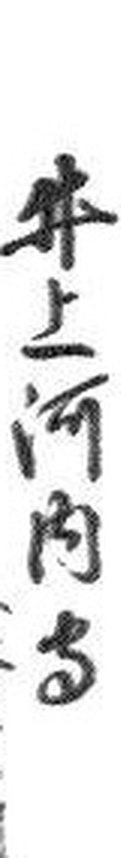井上河内守
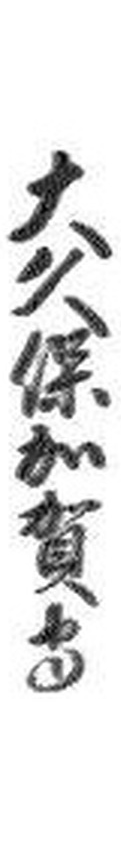大久保加賀守
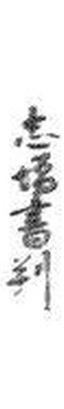忠増書判
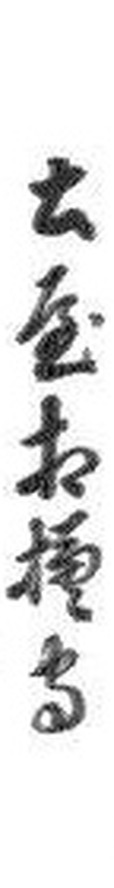土屋相模守
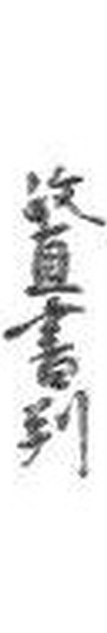政直書判
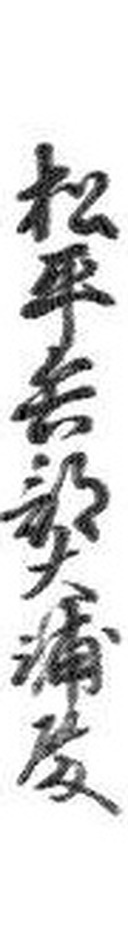松平兵部大輔殿
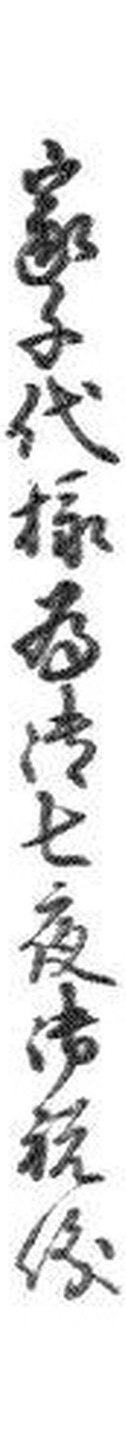家千代様為御七夜御祝儀
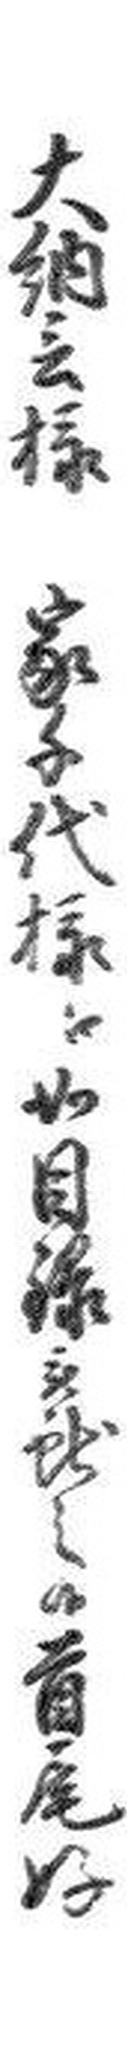大納言様家千代様江如目録被献之候首尾好
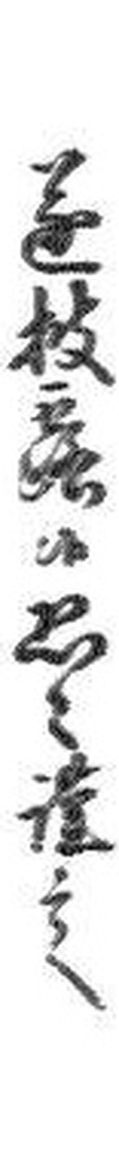遂披露候恐々謹言

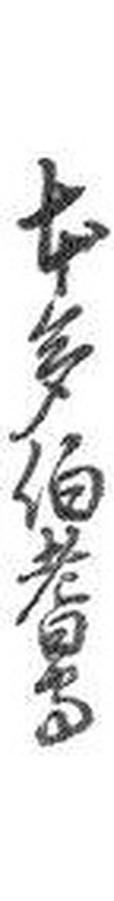本多伯耆守
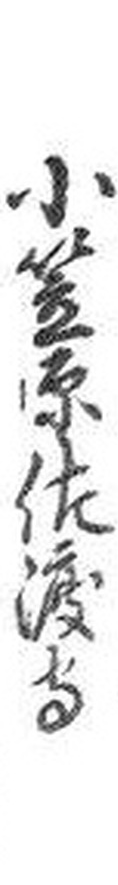小笠原佐渡守
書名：家譜 二十四 吉品公 従宝永三年到同五年
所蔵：福井県文書館 Fukui Prefectural Archives
